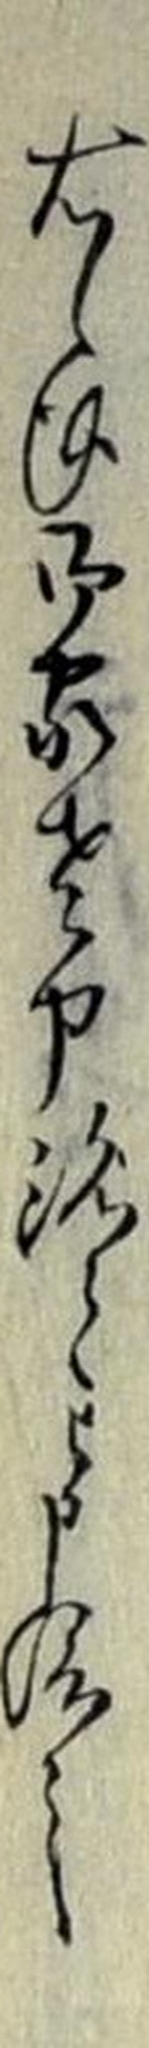右之趣御家老中銘々へ被申渡之
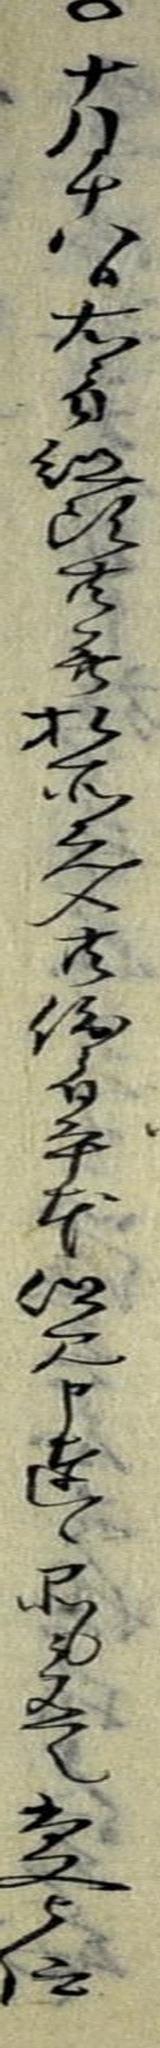〇十月十八日右ニ付組頭共并札所元〆共儀ニ付平本但見申達候品も有之尚又被仰
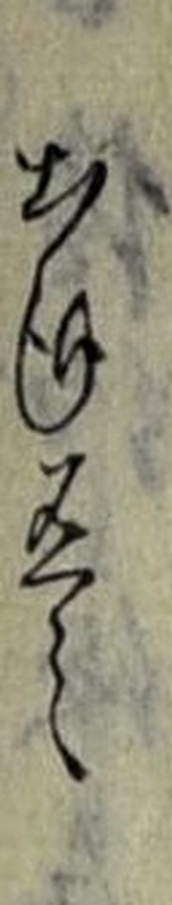出趣有之
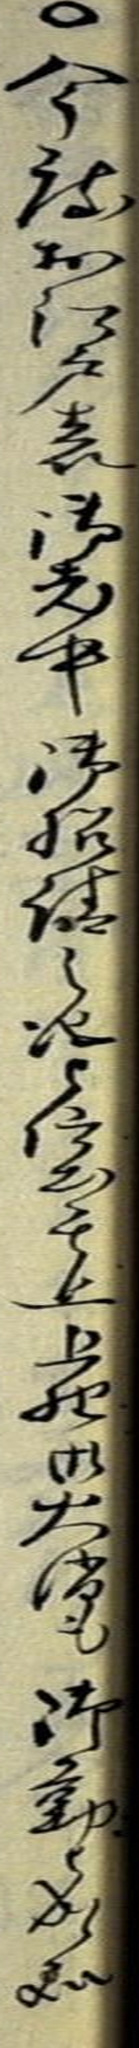〇今度於江戸表御老中御招請之儀被仰出其上上野御火消も御勤被成候処
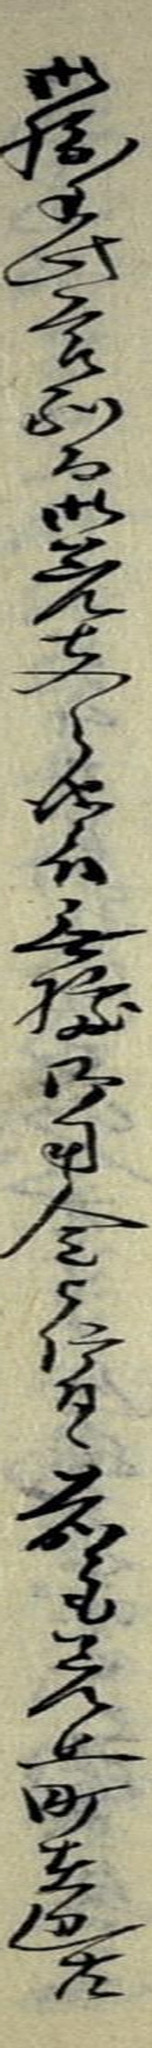御勝手此節別而御差支之儀ニ付無拠御用金被仰付候前々も差上町在辺共
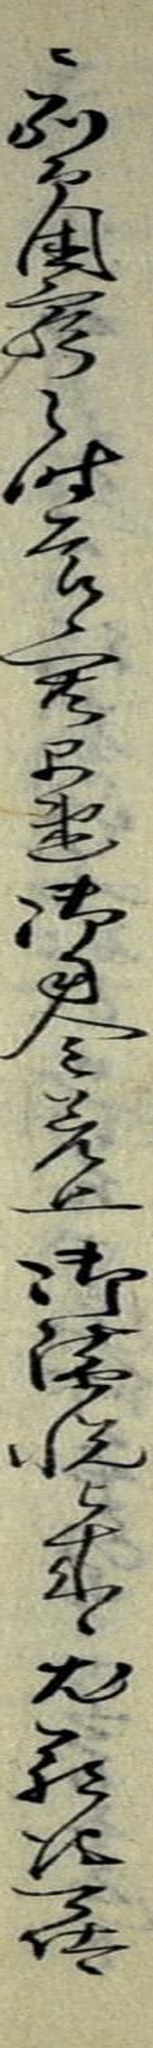ニ別而困窮之時節候へ共早速御用金差上御満悦被成候尤難儀可仕候
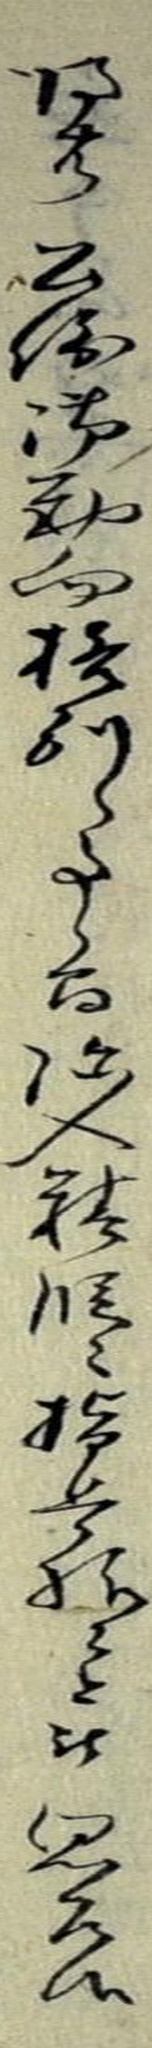得共公儀御勤向格別之事候間弥入精段々指上候様ニと被思召候
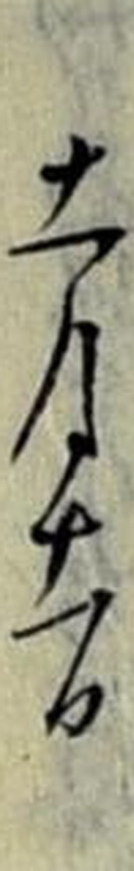十一月十一日
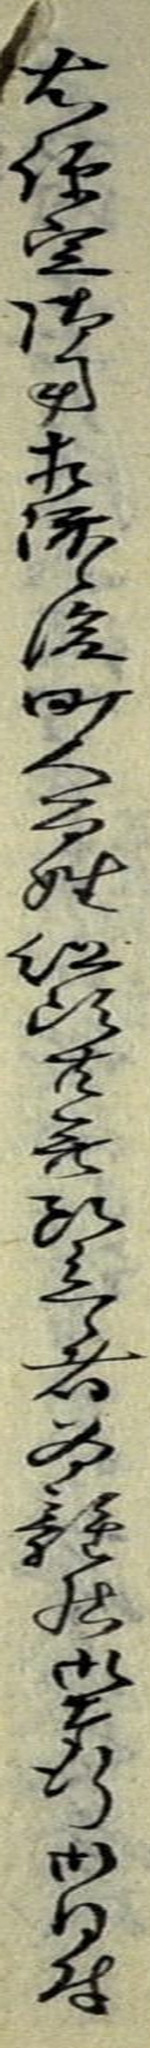右評定御用相済候後町人百姓組頭共并頭立候者為雑居御奉行御目付
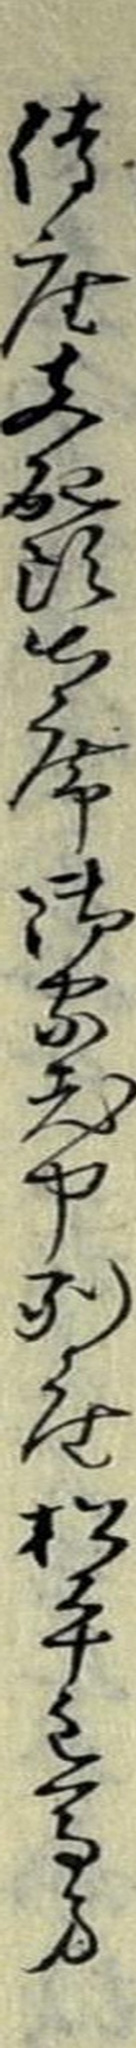侍座支配頭出席御家老中列座松平主馬方
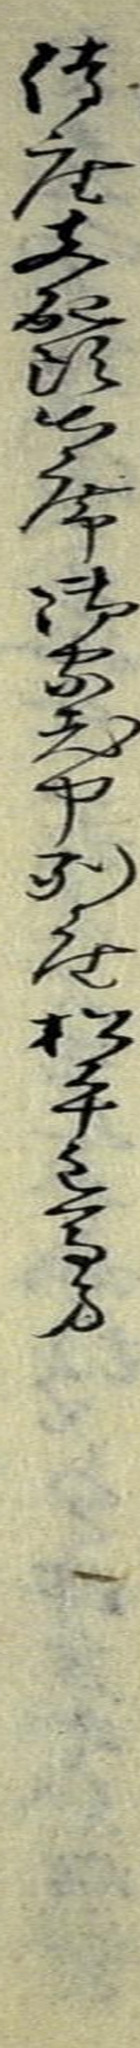侍座支配頭出席御家老中列座松平主馬方
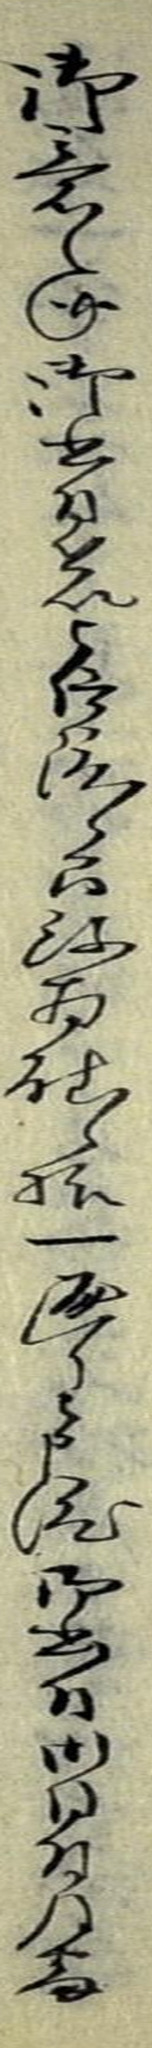御意之趣御書付を以被仰渡候間致拝聴候様一通り被申渡御書付御目付月番
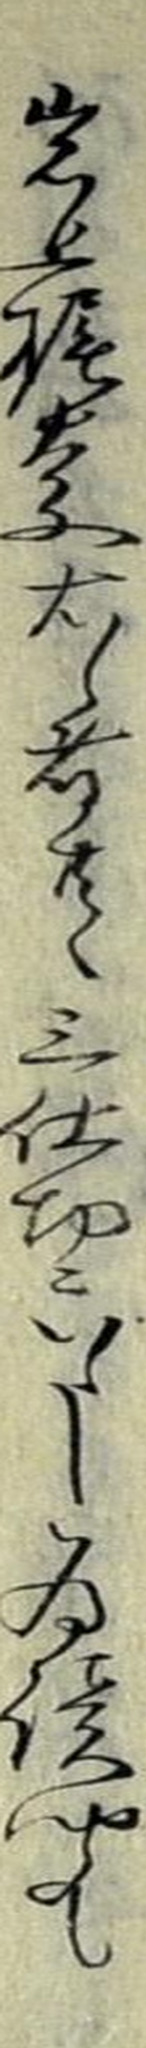岩上梶大夫右之者共へ三仕切ニいたし為読聞候
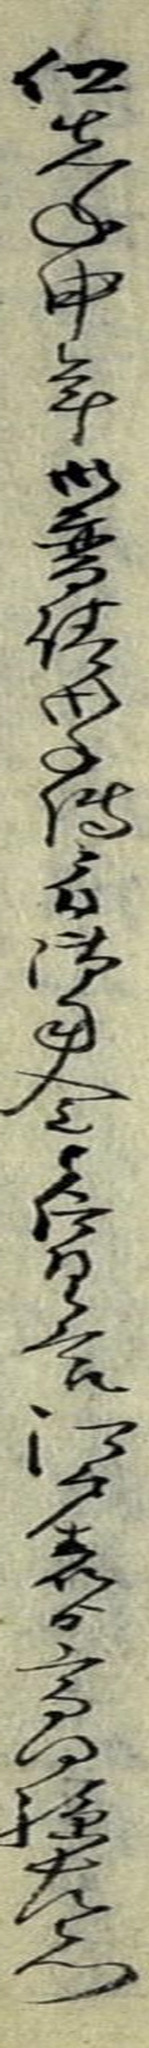但先年申年御普請御手伝ニ付御用金被仰付候節江戸表ゟ高田孫左衛門
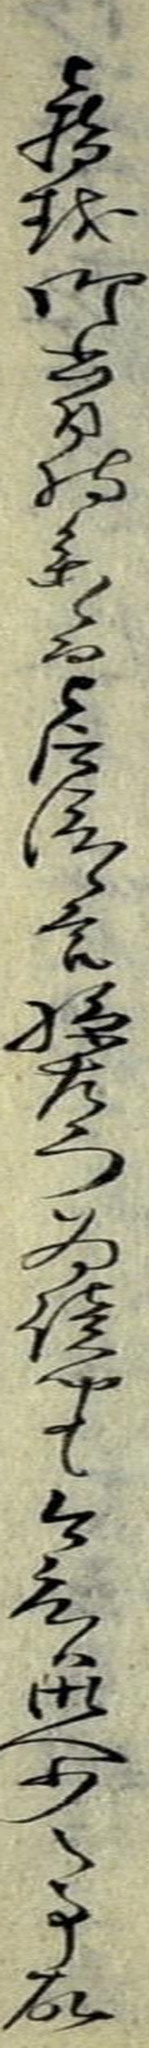被指越御書付持参候而被仰渡候節孫左衛門為読聞候今度ハ御人少之事故
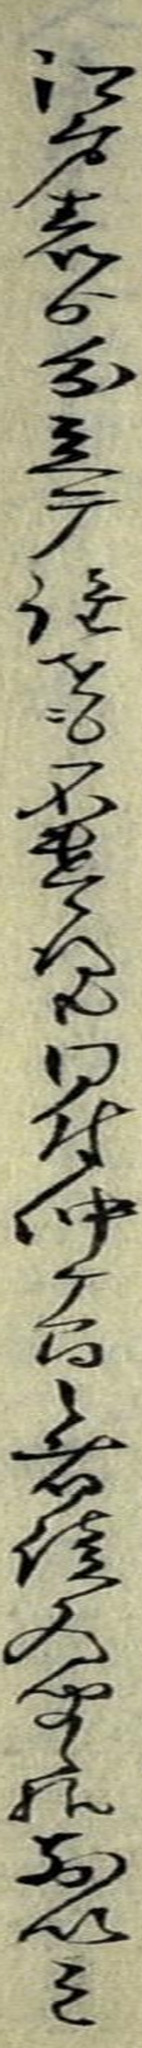江戸表ゟ分立テ誰をも不遣候得共目付仲ケ間之者読為聞候様前以主
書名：命令之部 一
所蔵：福井県文書館 Fukui Prefectural Archives
